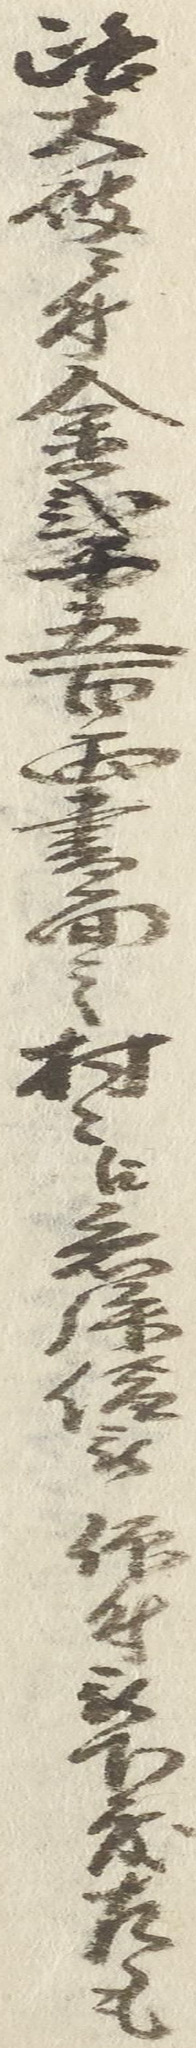路大破ニ付金弐千五百両書面之村々江急拝借被仰付被下度左も
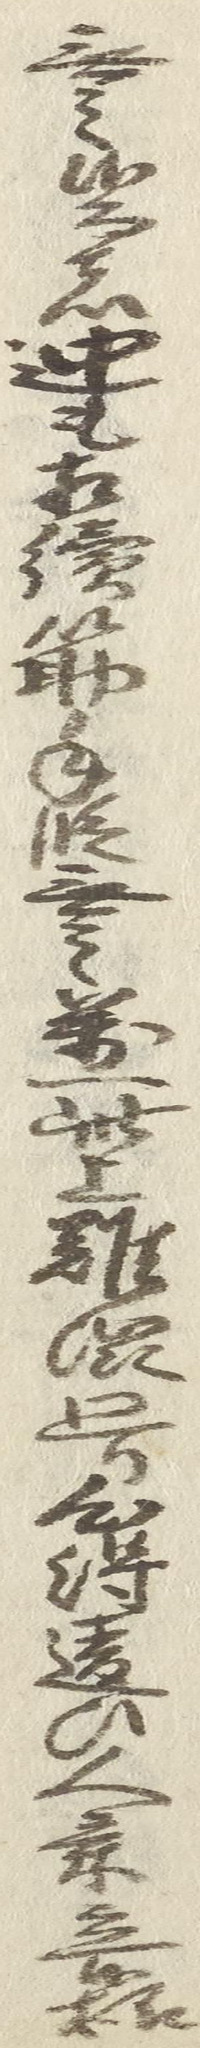無之候ては迚も相続筋手段無之万一此上難渋廻り心得違ひ人気立候様

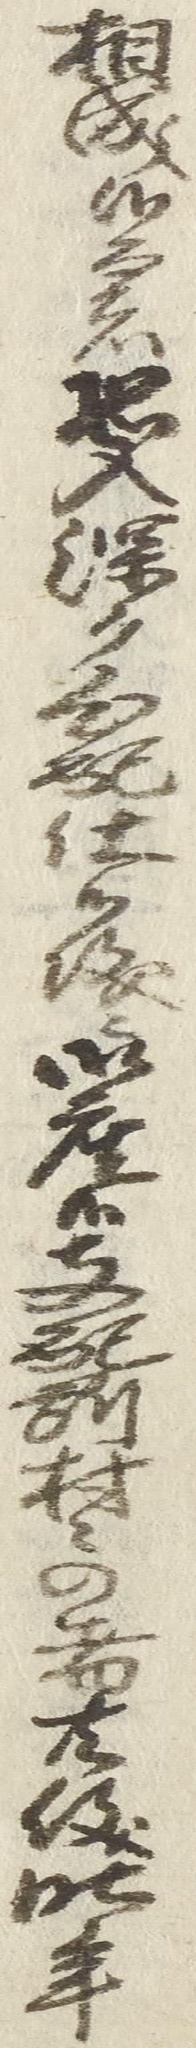相成候而は恐入深ㇰ心配仕候儀二御座候支配所村々之者共儀昨年
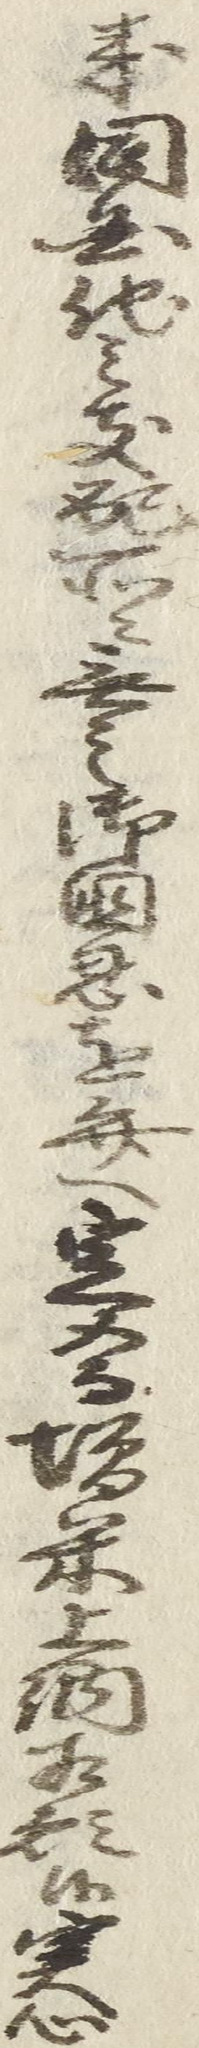來同国地之支配所二無之御国恩を弁へ定合増米上納相願候実心
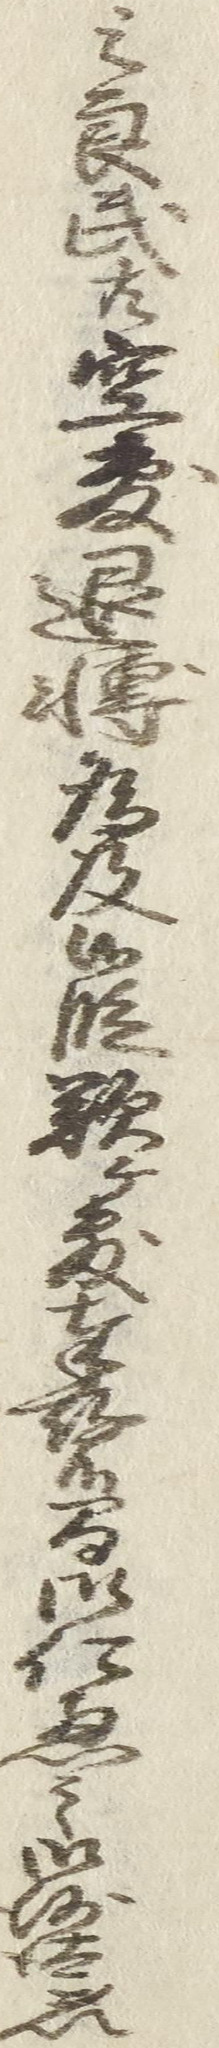之良民共空敷退転為及候段歎ヶ敷奉存候間恩仁恵之恩沙汰ヲ以
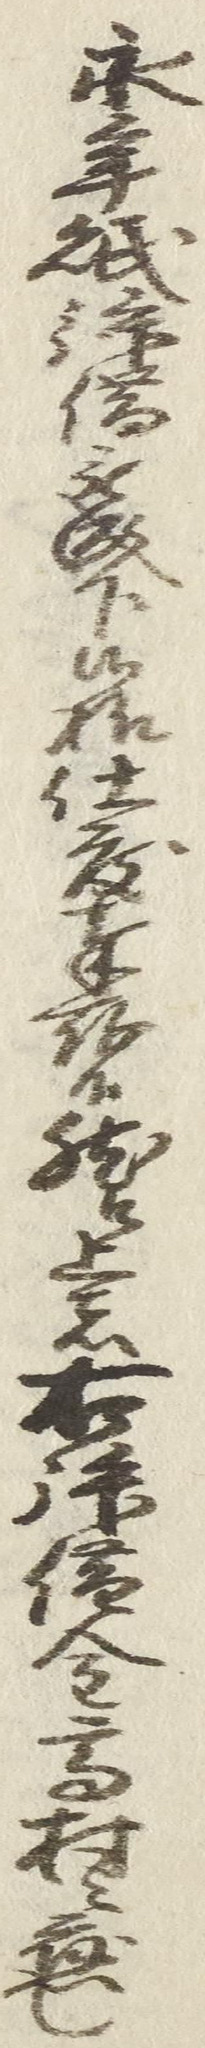永年賦拝借被成下候様仕度奉願候然ㇽ上は右拝借金高村々二応じ
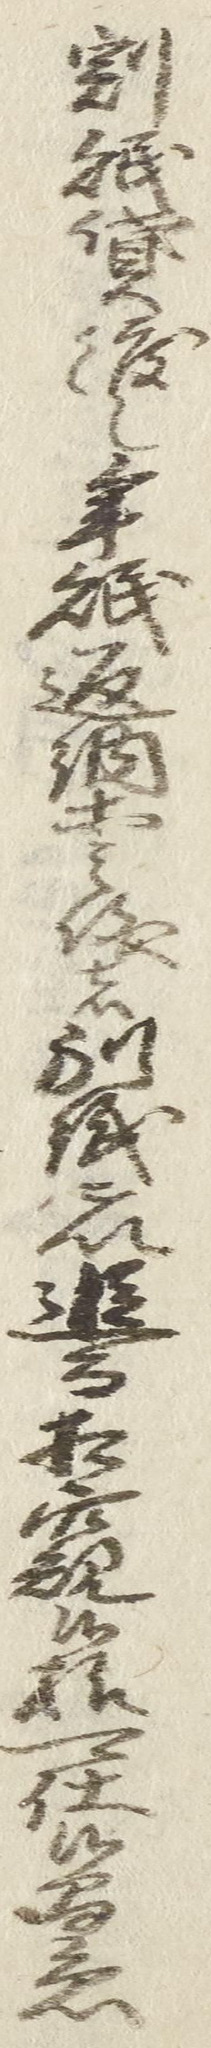割賦貸渡し年賦返納等之儀は別紙ヲ以追而相窺候様可仕候間急
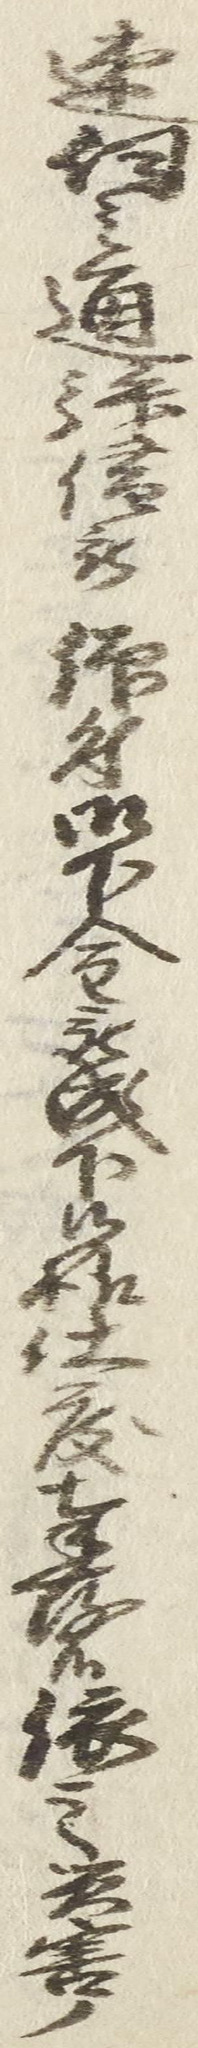速伺之通拝借被仰付恩下金被成下候様仕度奉存依之災害ノ
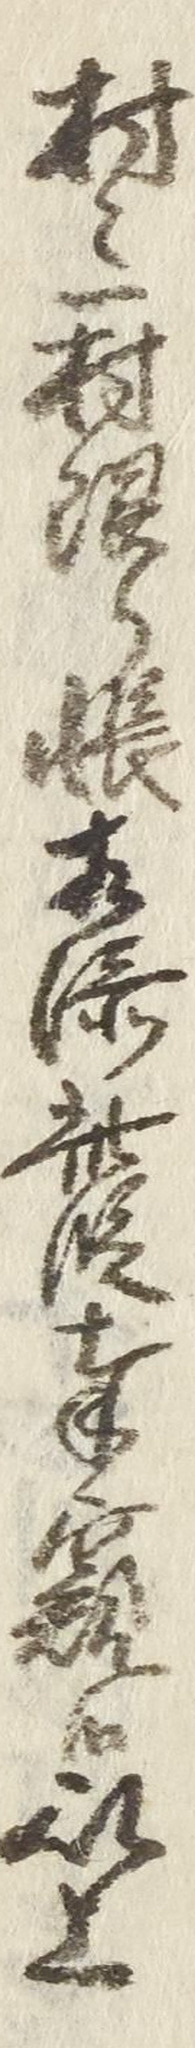村々一村限り帳相添此暖奉窺候以上
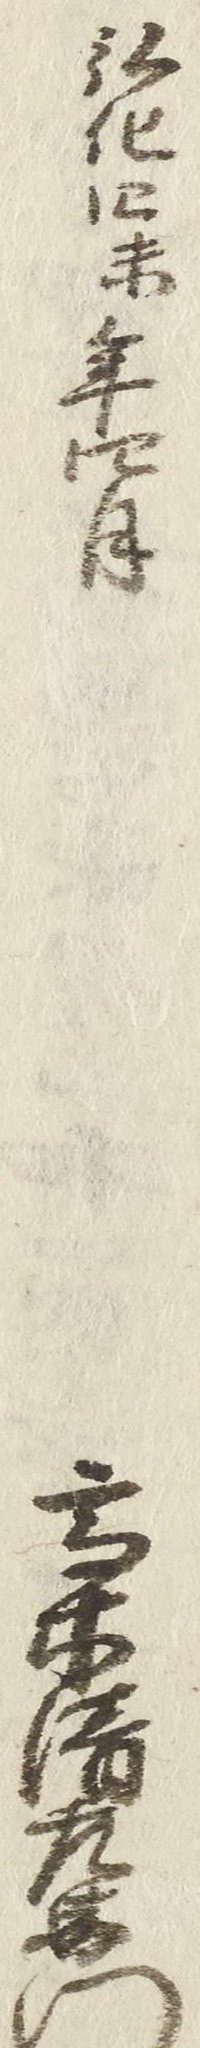弘化四未年四月高木清左衛門
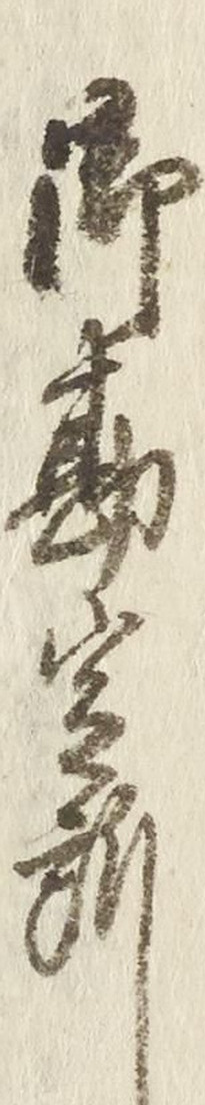御勘定所
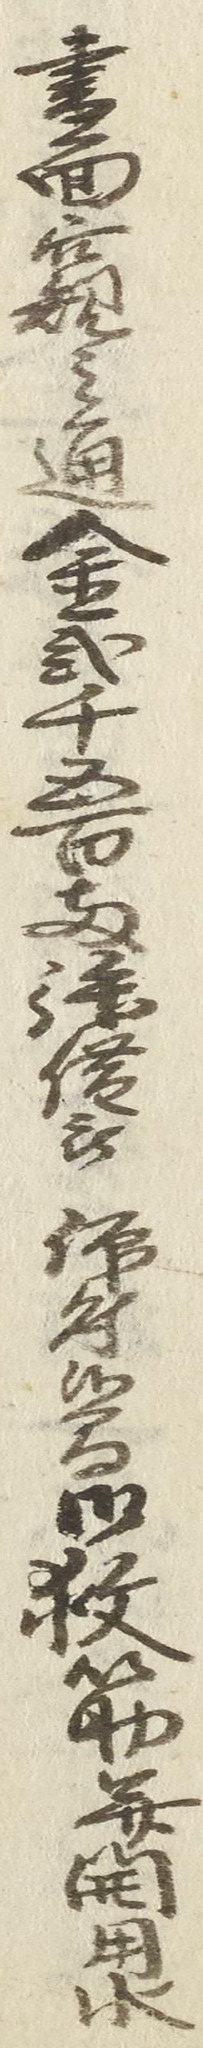書面窺之通金金弐千五百両拝借被仰付候間御救筋并開用水
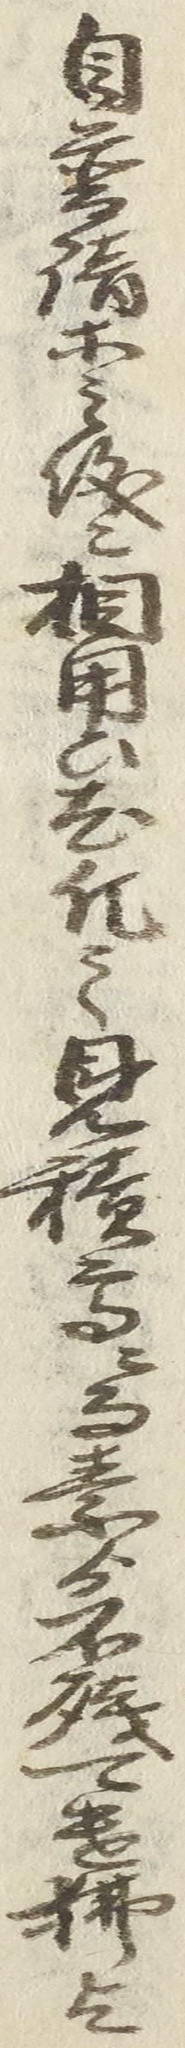自普請等之儀二相用ひ尤凡之見積高二而素ゟ不残可遣払と
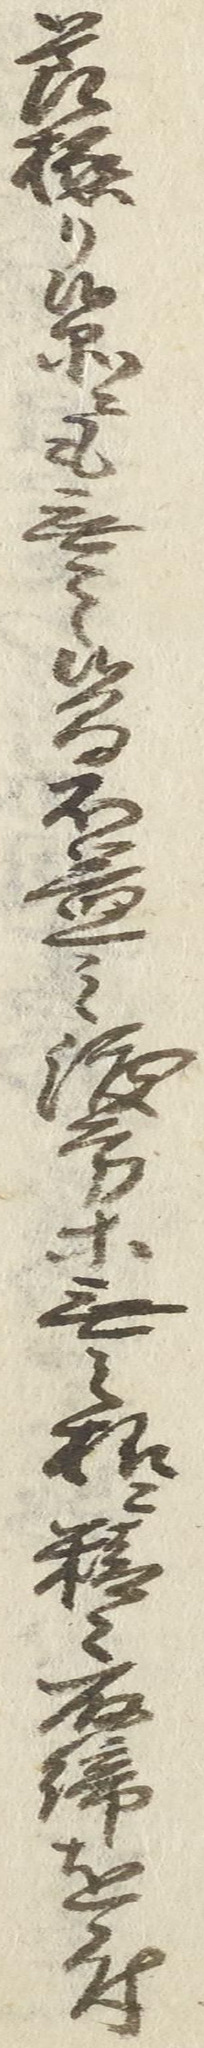節構り候品二も無之候間不益之渡方等無之様二精々取締を付
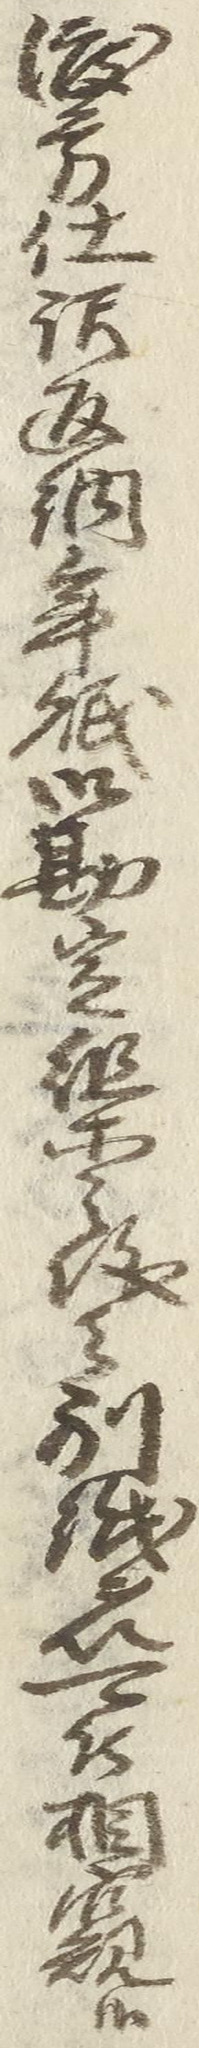渡方仕訳返納年賦御勘定組等之儀は別紙ヲ以可被相窺候
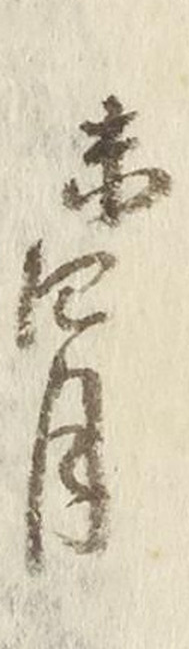未四月
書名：従往古地震御届書記誌之一
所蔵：東京大学地震研究所図書室 Earthquake Research Institute Library, The University of Tokyo, JAPAN
